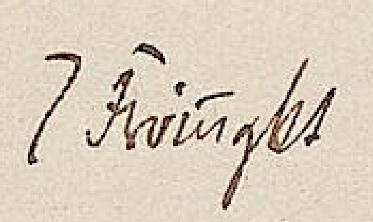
] Frömigkt
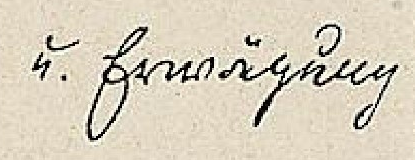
u. Erwägung
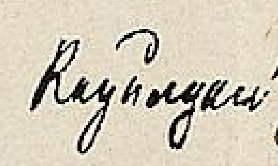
Regungen
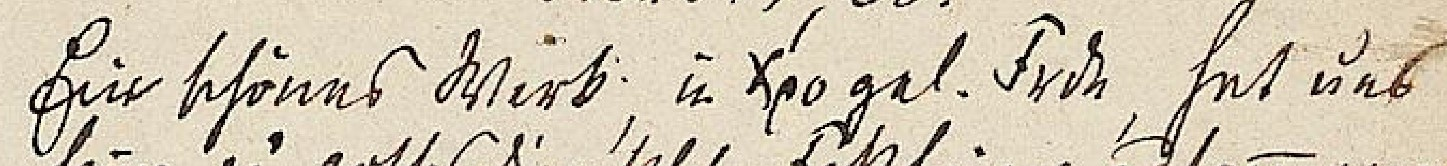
Ein schönes Werk, in Χρo gel. Frde, hat uns
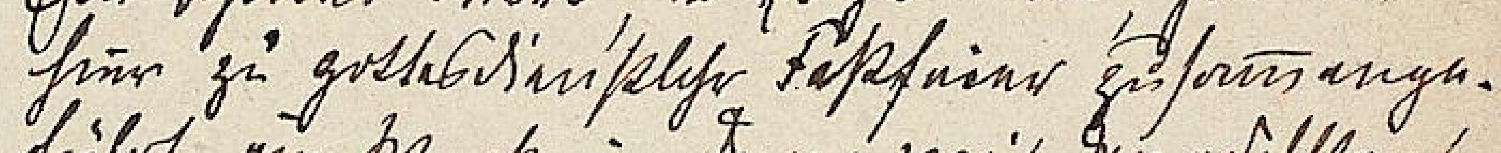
hier zu gottesdienstlchr Festfeier zusamenge¬
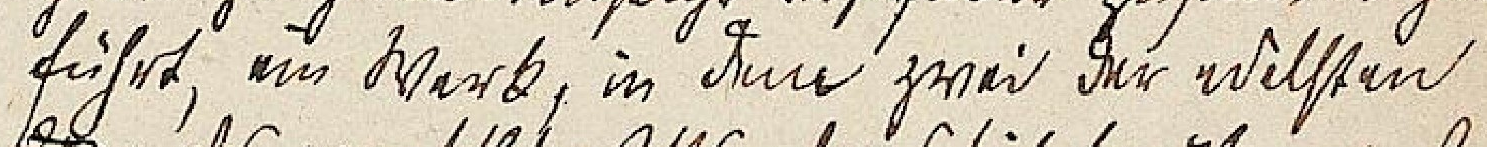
führt, ein Werk, in dem zwei der edelsten
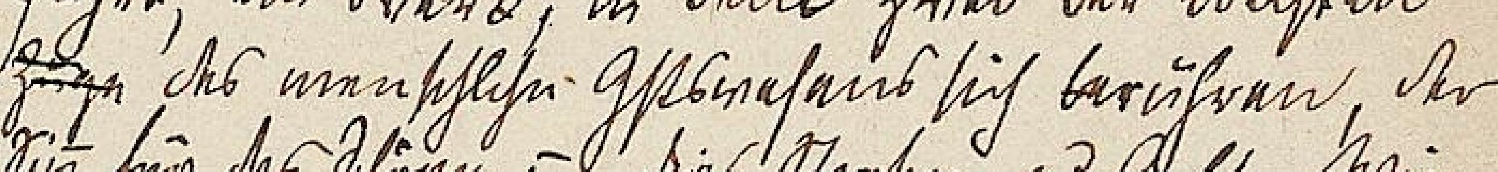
Züge des menschlchn Gstswesens sich berühren, der
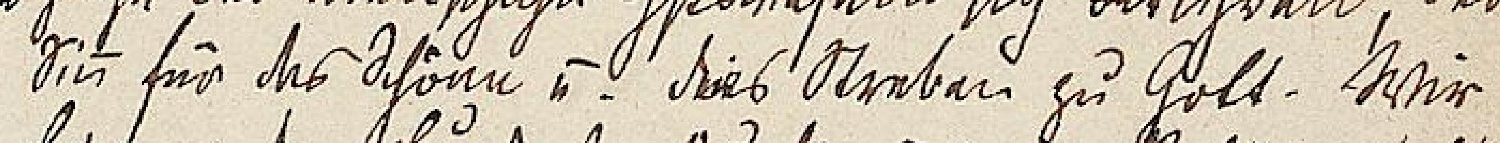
Sin für das Schöne u. dies Streben zu Gott. Wir
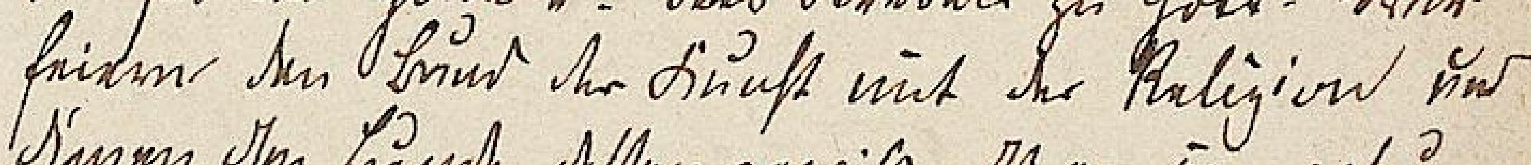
feiern den Bund der Kunst mit der Religion und
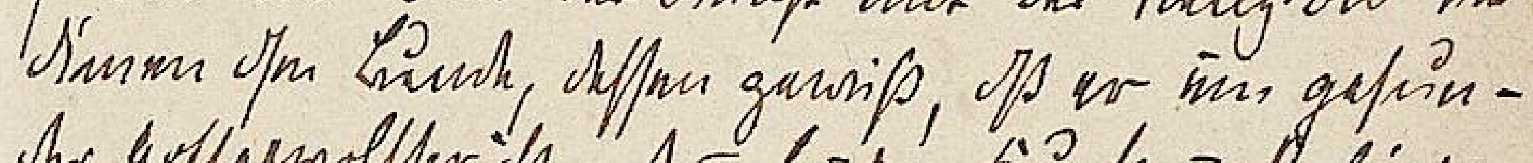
dienen dsm bunde, dessen gewiß, dß er ein gesun¬
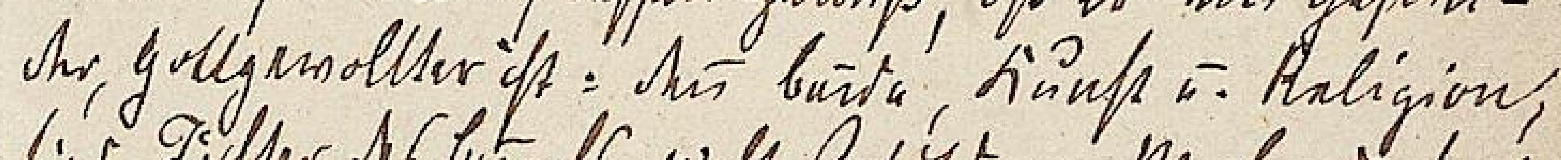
der, gottgewollter ist: den beide, Kunst u. Religion,
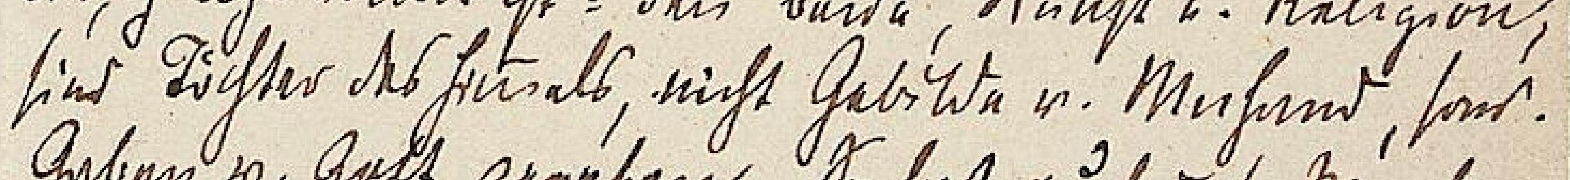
sind Töchter des Himmels, nicht Gebilde v. Mnhand, sond.
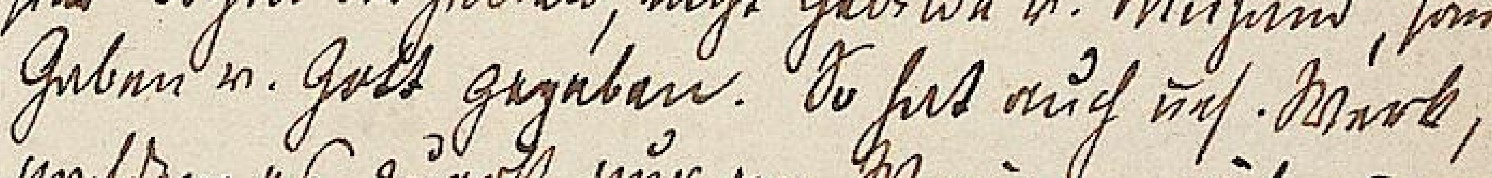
Gaben v. Gott gegeben. So hat auch uns. Werk,
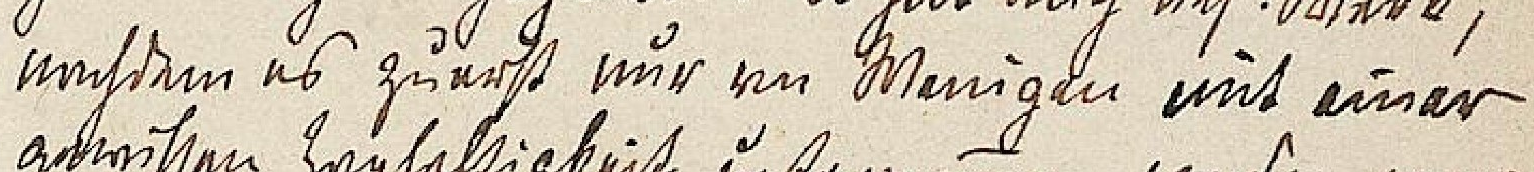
nachdem es zuerst nur von Wenigen mit einer
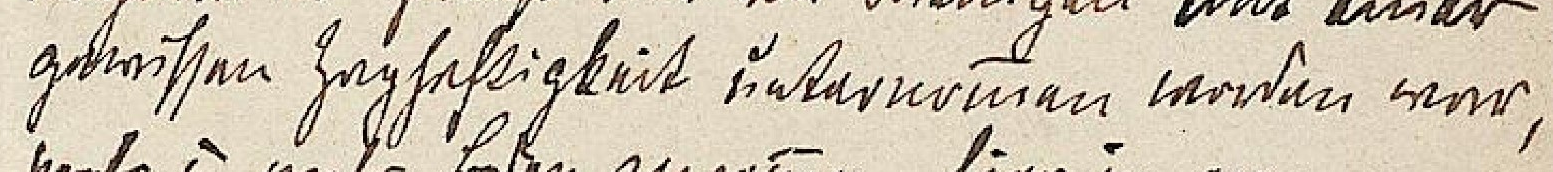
gewissen Zaghaftigkeit unternommen worden war,
